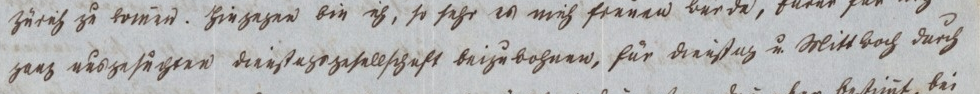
ganz ausgesuchten Dienstagsgesellschaft beizuwohnen, für Dienstag u. Mittwoch durch
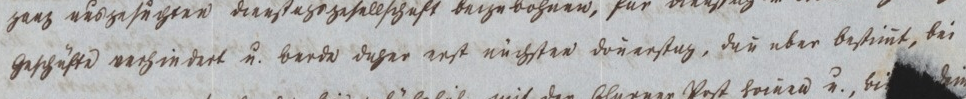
Geschäfte verhindert u. werde daher erst nächsten Donnerstag, dann aber bestimmt, bei
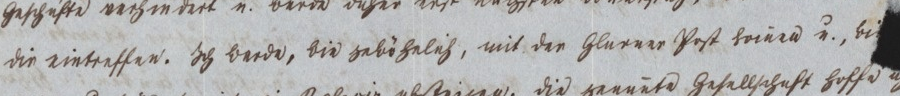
dir eintreffen. Ich werde, wie gewöhnlich, mit der Glarner Post kommen u., wie dies
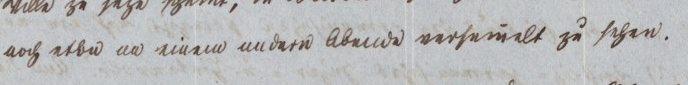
noch etwa an einem andern Abende versammelt zu sehen.
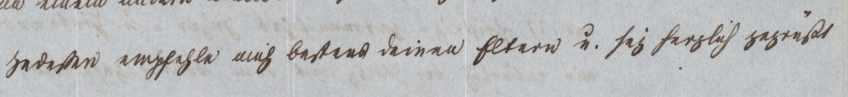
Indessen empfehle mich bestens deinen Eltern u. sey herzlich gegrüßt
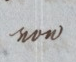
von
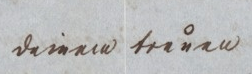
deinem treuen
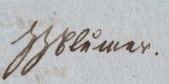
J J Blumer.
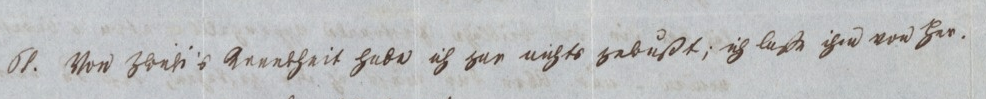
PS. Von Zwicki's Krankheit habe ich gar nichts gewußt; ich lasse ihm von Her-
